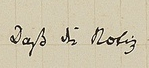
Daß die Notiz
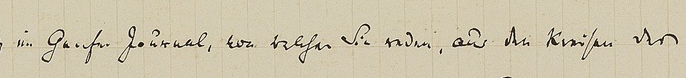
im Genfer Journal, von welcher Sie reden, aus den Kreisen des
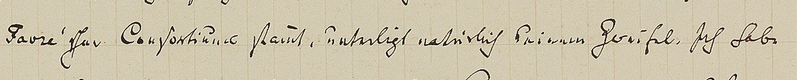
Favre'schen Consortiums stammt, unterliegt natürlich keinem Zweifel. Ich habe
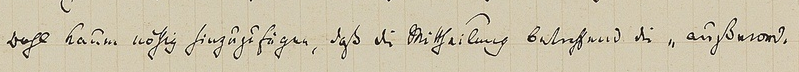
wohl kaum nöthig hinzuzufügen, daß die Mittheilung betreffend die «außerord.
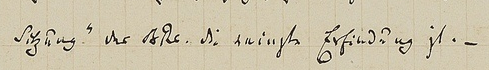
Sitzung» des BRs. die reinste Erfindung ist. –
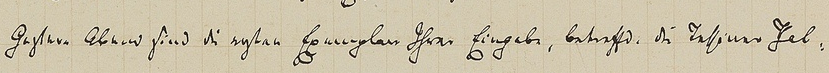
Gestern Abend sind die ersten Exemplare Ihrer Eingabe, betreffd. die Tessiner Thal-
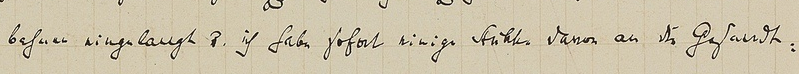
bahnen eingelangt u. ich habe sofort einige Stükke davon an die Gesandt-
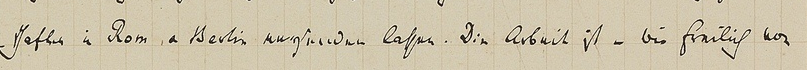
schaften in Rom u. Berlin versenden lassen. Die Arbeit ist – wie freilich von
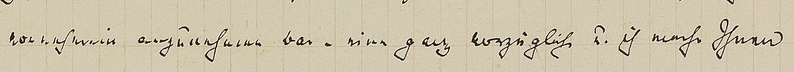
vorneherein anzunehmen war – eine ganz vorzügliche u. ich mache Ihnen
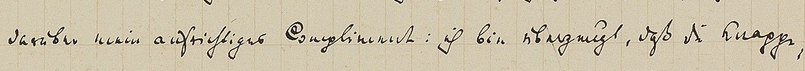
darüber mein aufrichtiges Compliment: ich bin überzeugt, daß die knappe,
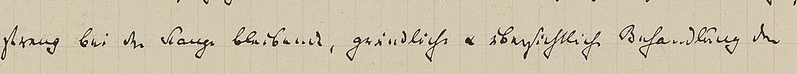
streng bei der Stange bleibende, gründliche & übersichtliche Behandlung der
